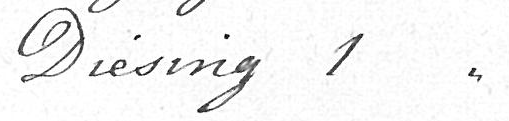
Diesing 1 "
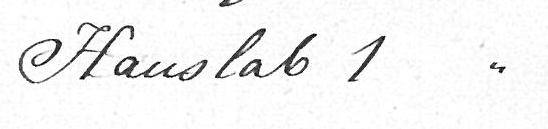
Hauslab 1 "
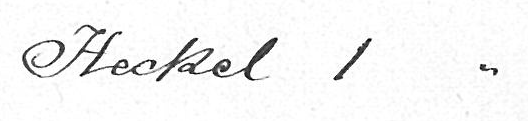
Heckel 1 "
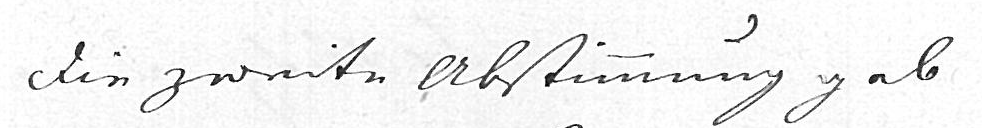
Die zweite Abtstimmung gab
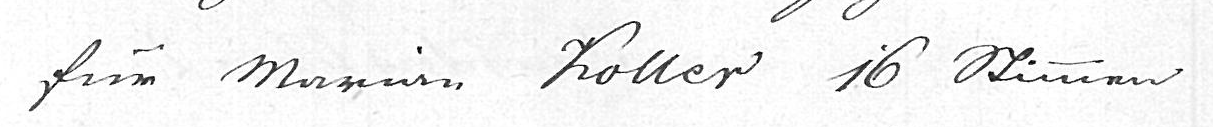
für Maria Koller 16 Stimmen
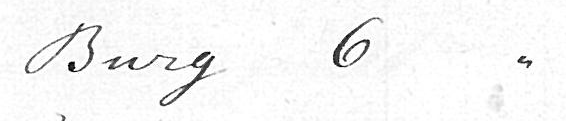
Burg 6 "
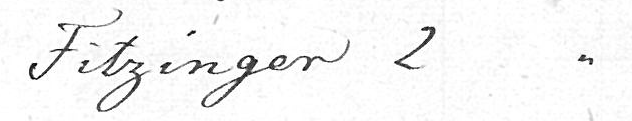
Fitzinger 2 "
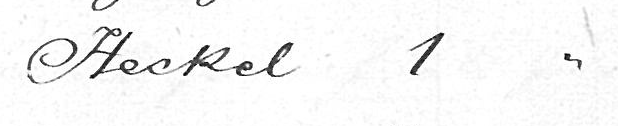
Heckel 1 "
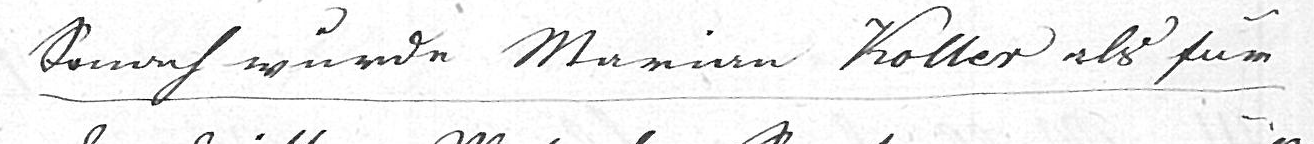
Sonach wurde Marian Koller als für
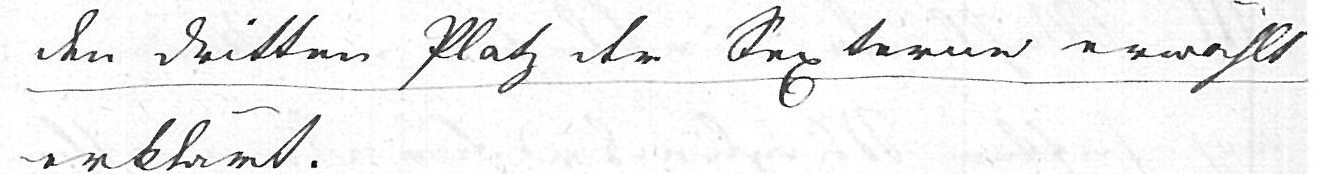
den dritten Platz der Sexterne erwählt
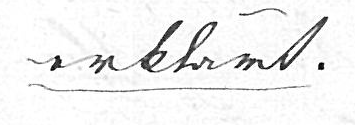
erklärt.
